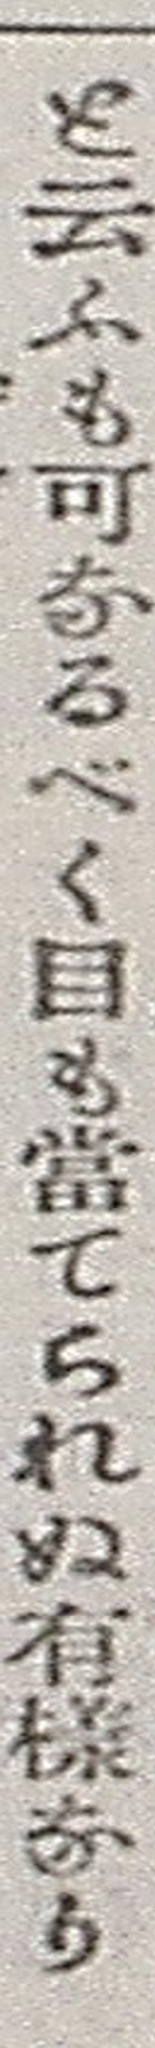と云ふも可なるべく目も当てられぬ有様なり
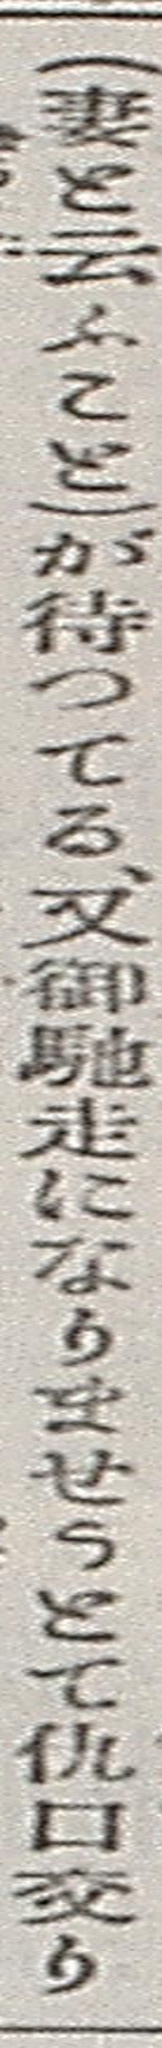と云ふこと）が待つてる、又御馳走になりませうとて仇口交り
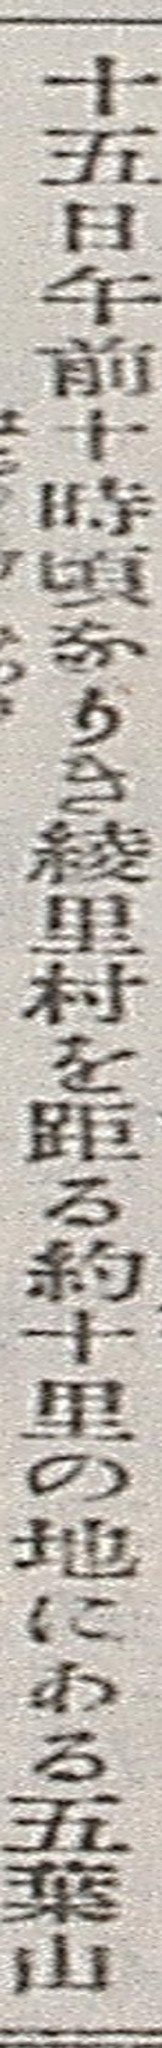十五日午前十時頃なりき綾里村を距る約十里の地にある五葉山
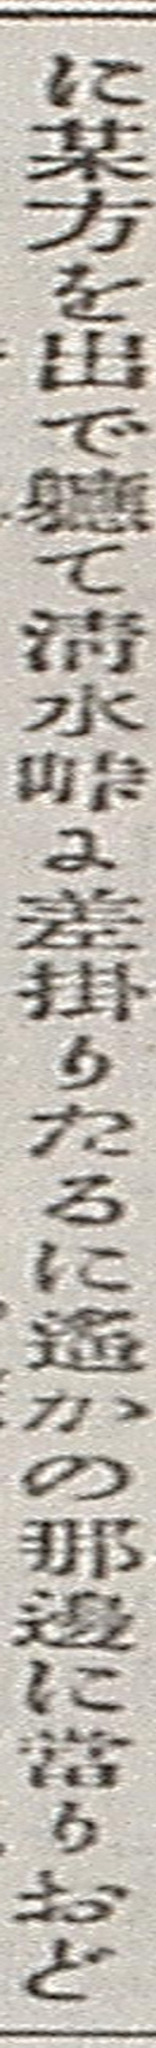に某方を出で軈て清水峠に差掛りたるに遙かの那辺に当りおど
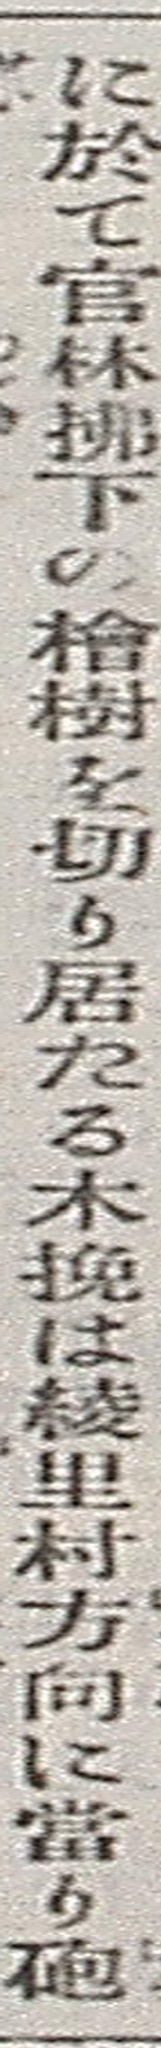に於て官林払下の檜樹を切り居たる木挽は綾里村方向に当り砲
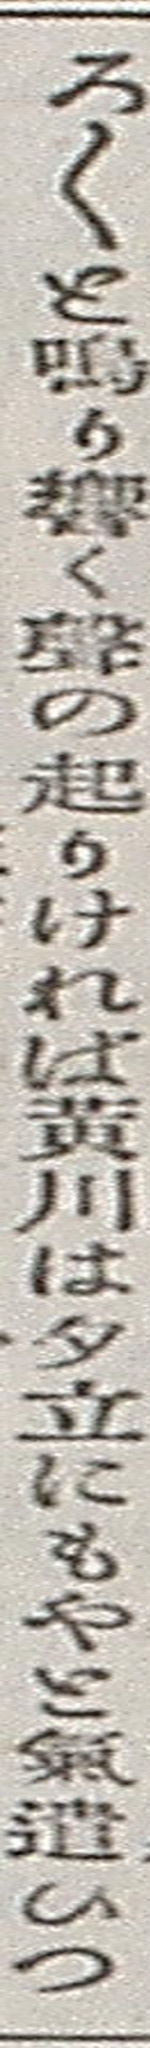ろ〳〵と鳴り響く声の起りければ黄川は夕立にもやと気遣ひつ
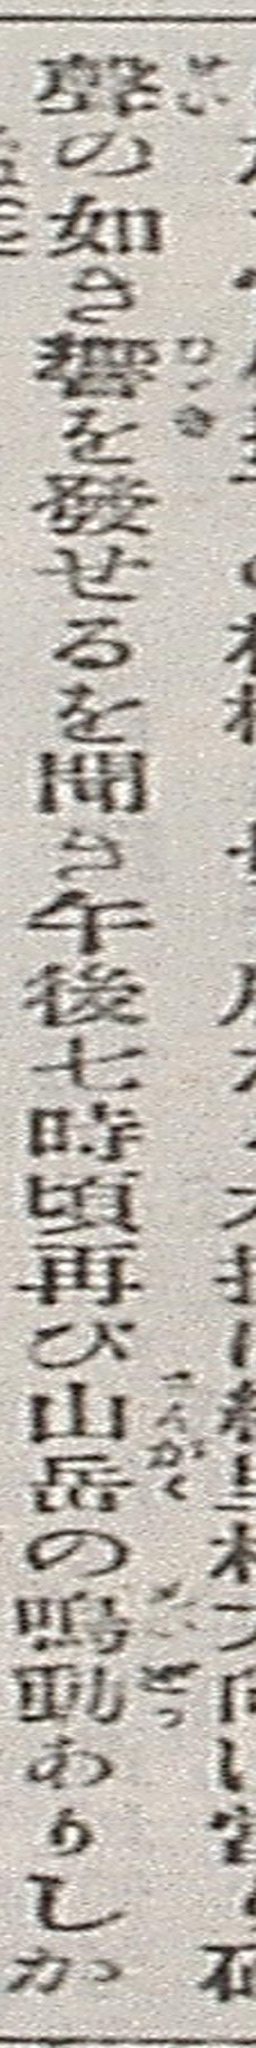声の如き響を発せるを聞き午後七時頃再び山岳の鳴動ありしか
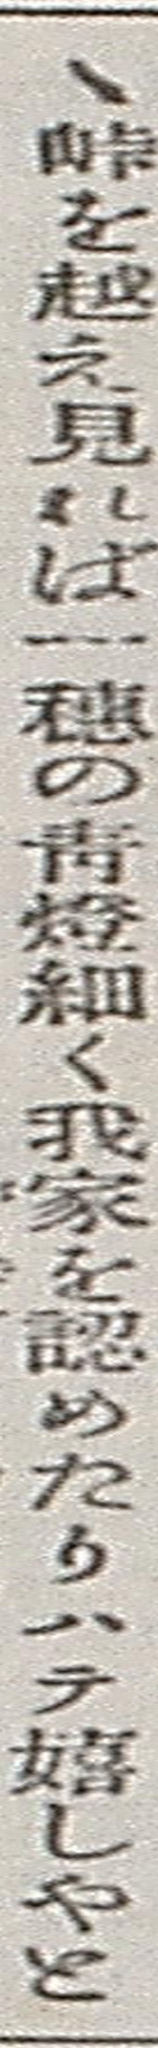ゝ峠を越え見れば一穂の青灯細く我家を認めたりハテ嬉しやと
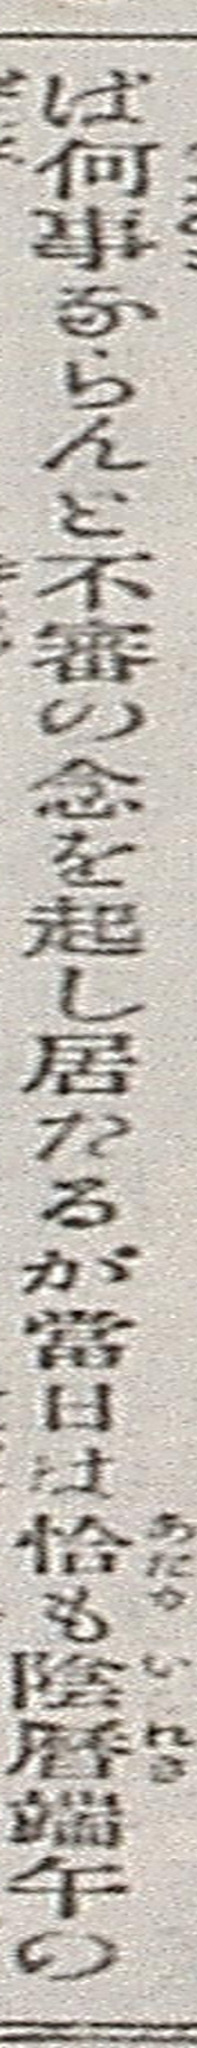は何事ならんと不審の念を起し居たるが当日は恰も陰暦端午の
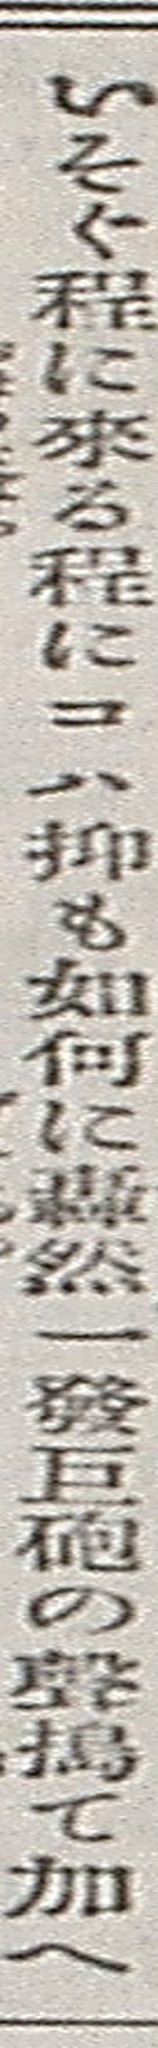いそぐ程に来る程にコハ抑も如何に轟然一発巨砲の声搗て加へ
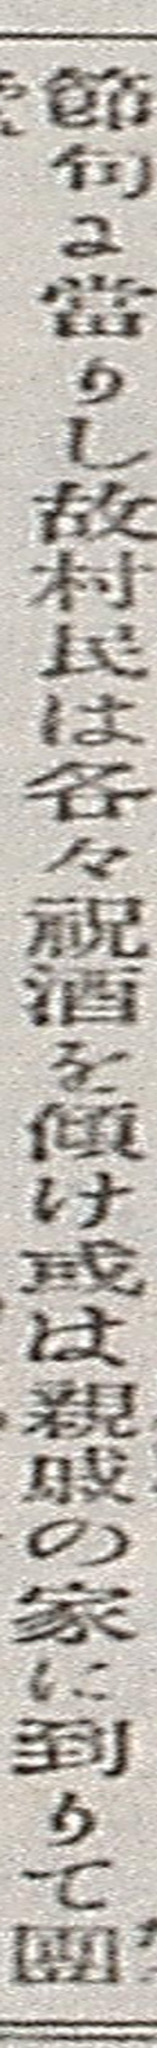節句に当りし故村民は各々祝酒を傾け或は親戚の家に到りて団
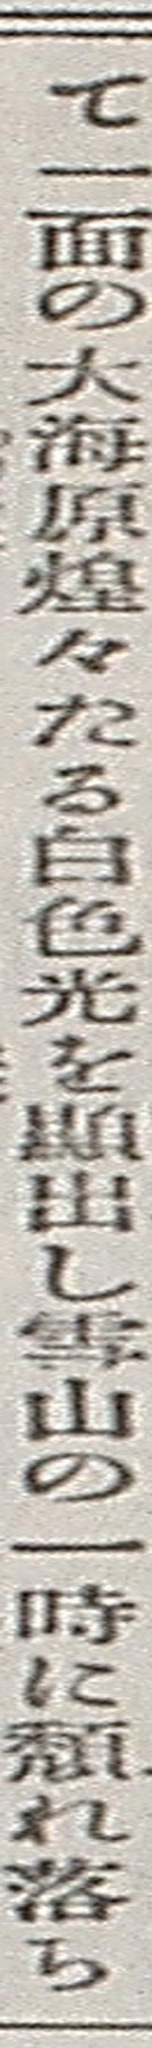て一面の大海原煌々たる白色光を顕出し雪山の一時に頽れ落ち
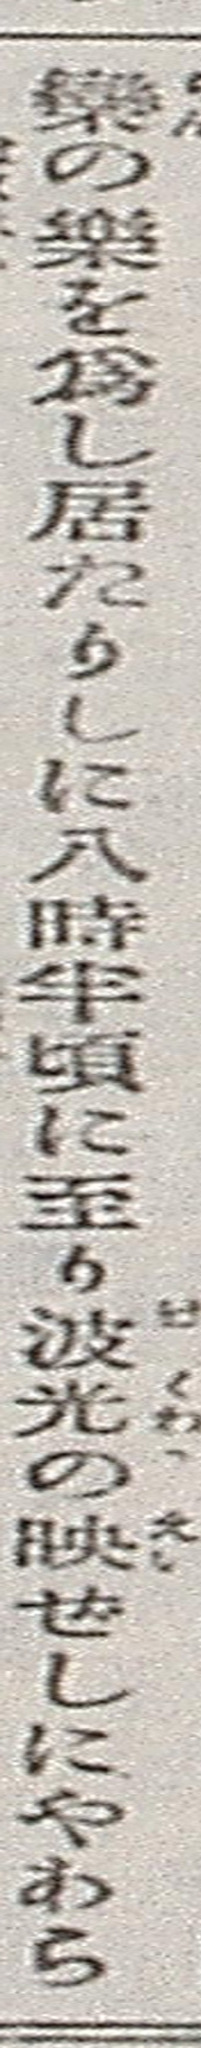欒の楽を為し居たりしに八時半頃に至り波光の映ぜしにやあら
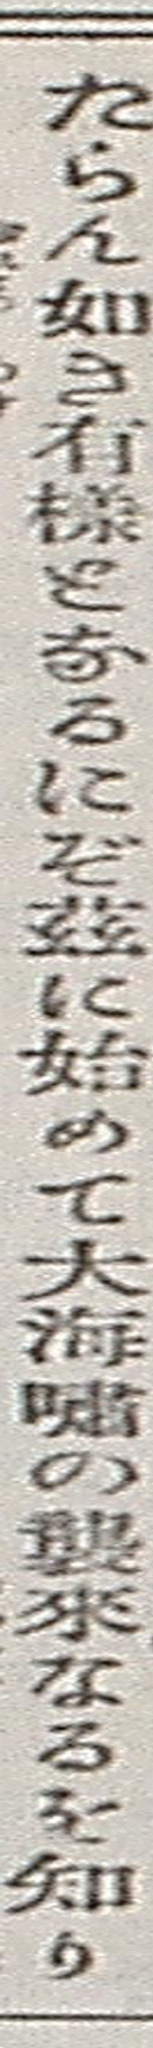たらん如き有様となるにぞ茲に始めて大海嘯の襲来なるを知り
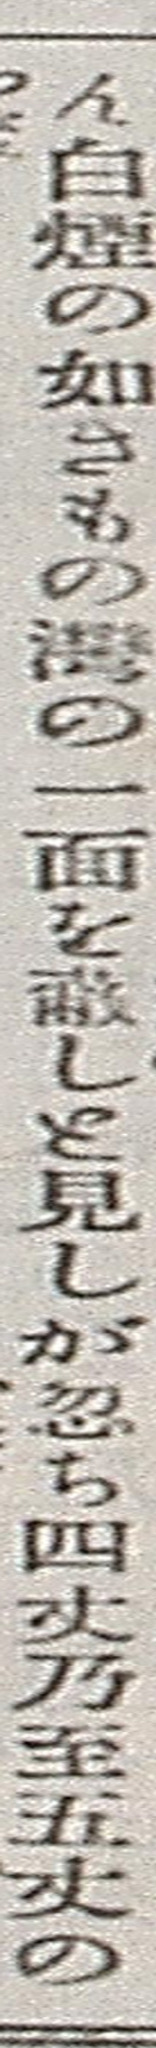ん白煙の如きもの湾の一面を蔽しと見しが忽ち四丈乃至五丈の
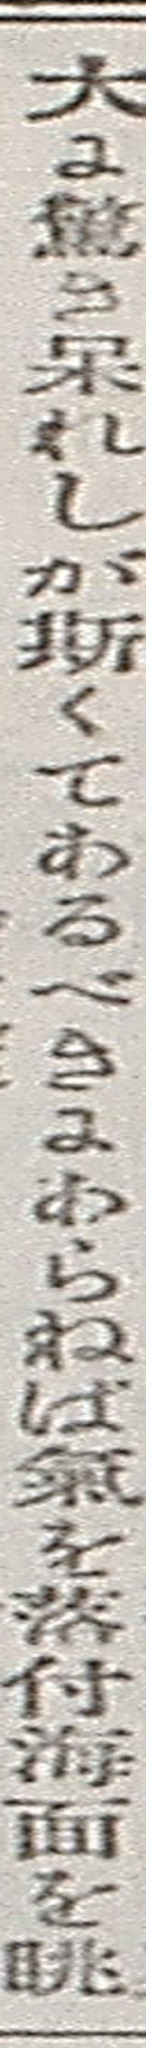大に驚き呆れしが斯くてあるべきにあらねば気を落付海面を眺
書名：風俗畫報臨時増刊第百二十號　大海嘯被害録（下）
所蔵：東京大学地震研究所図書室 Earthquake Research Institute Library, The University of Tokyo, JAPAN
